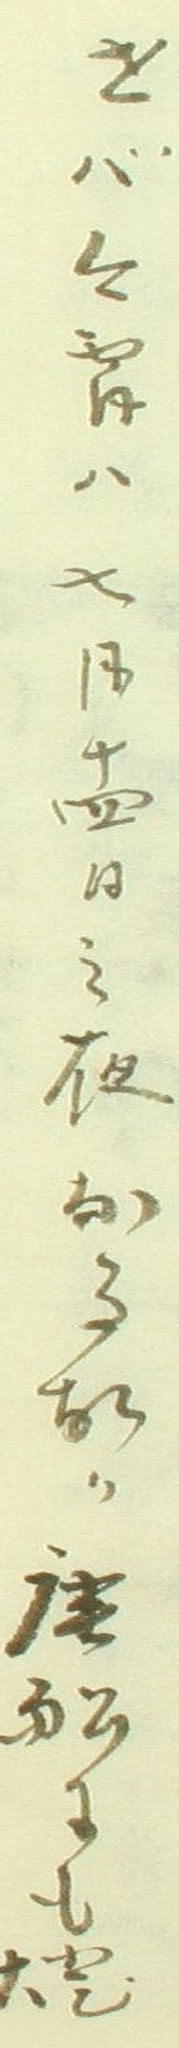せば今宵は七月十四日夜なる故か唐船にも燈
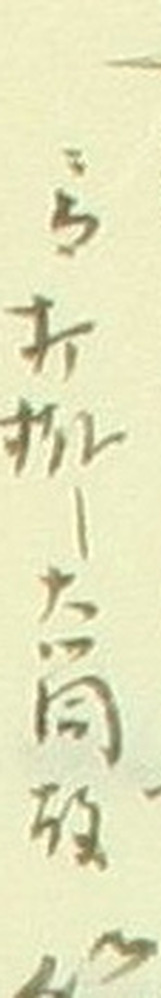に而打払し大筒故
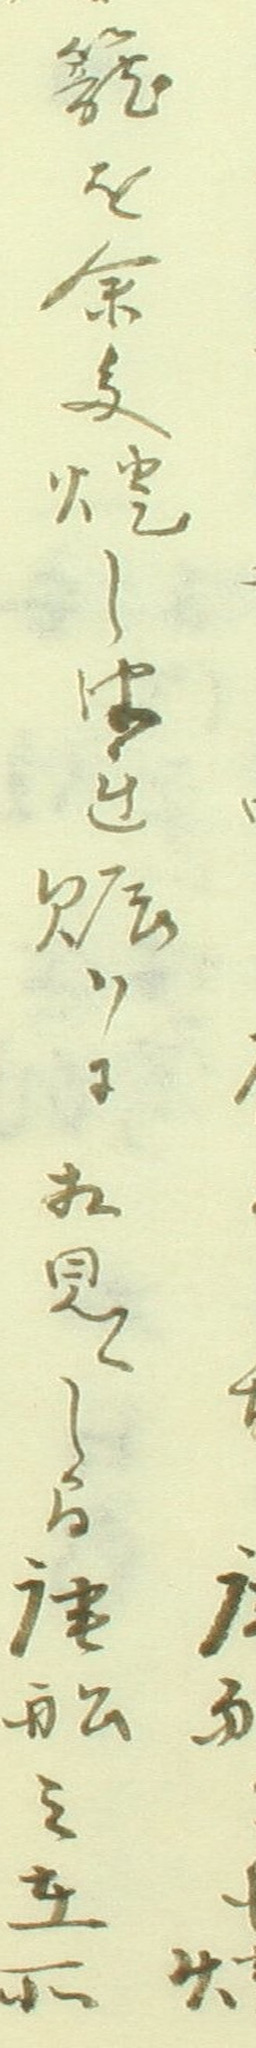籠を余多燈しつれ賑かに相見へし間唐船の在所
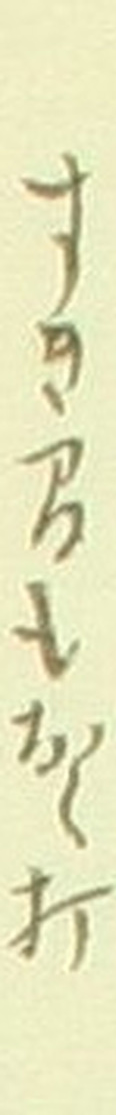すき間もなく打
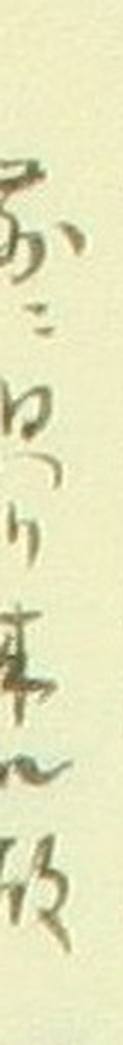前に廻り来る故
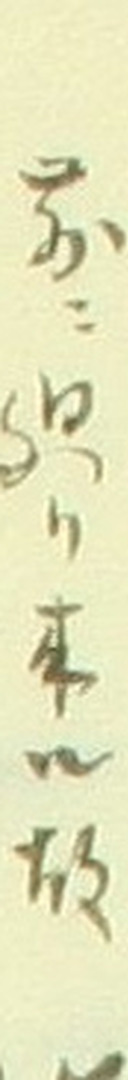前に廻り来る故
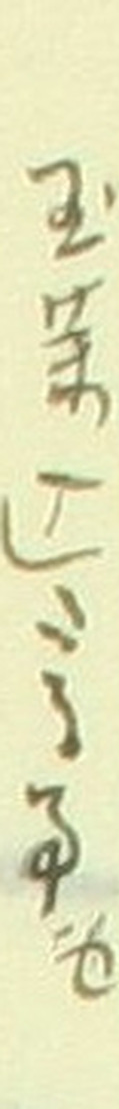玉萬込たる事も
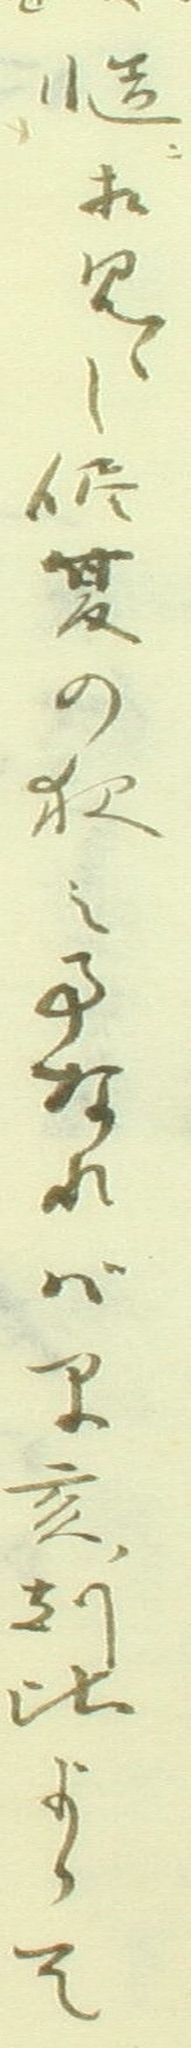慥相見へし侭夏の夜の事なれば早亥の刻ころ頃よりそ
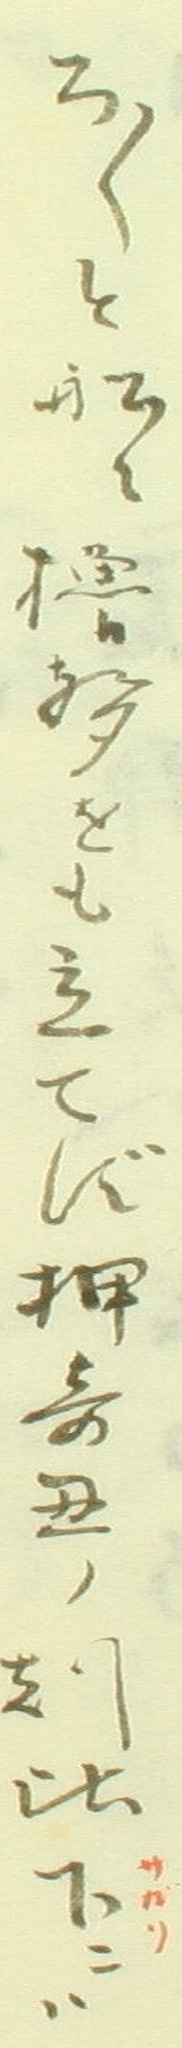ろそろと船の櫓声をも立てず押寄丑の刻頃下には
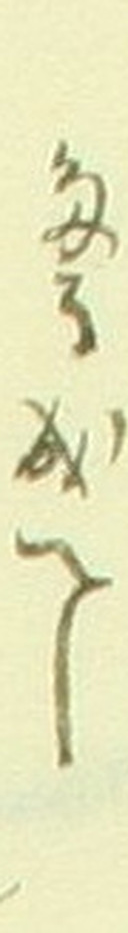たる成へし
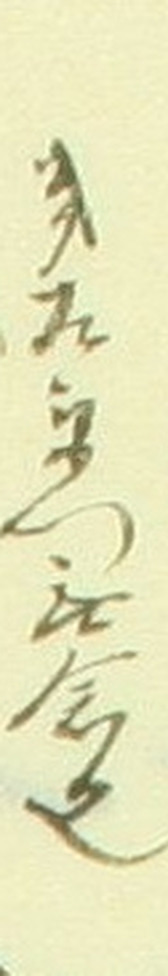幾左衛門無念也
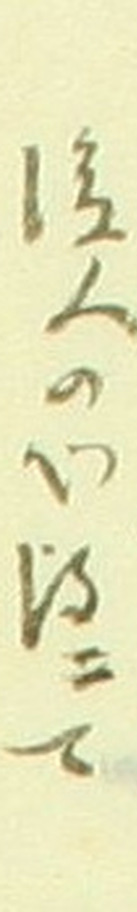後人の心得にて
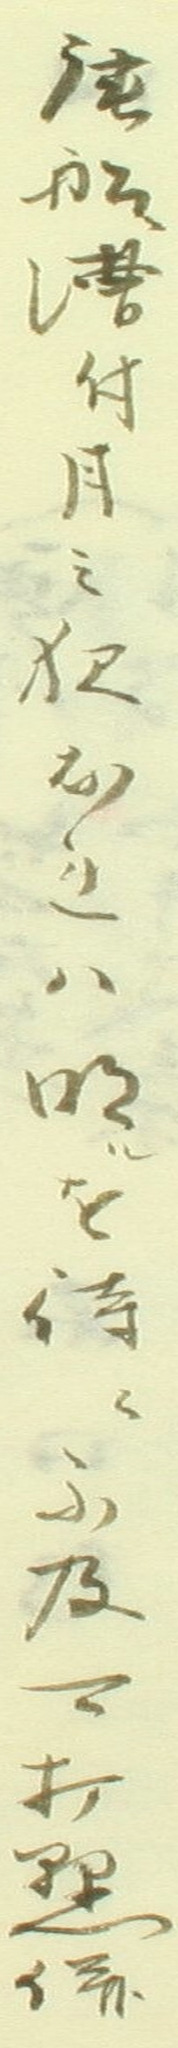唐船漕付月の夜なれは明るを待く不及可打懸併
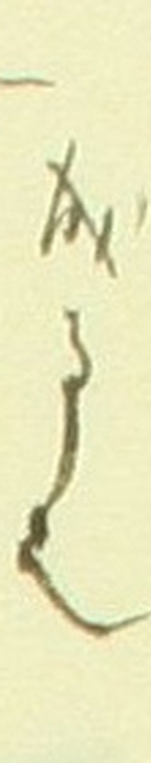成事也
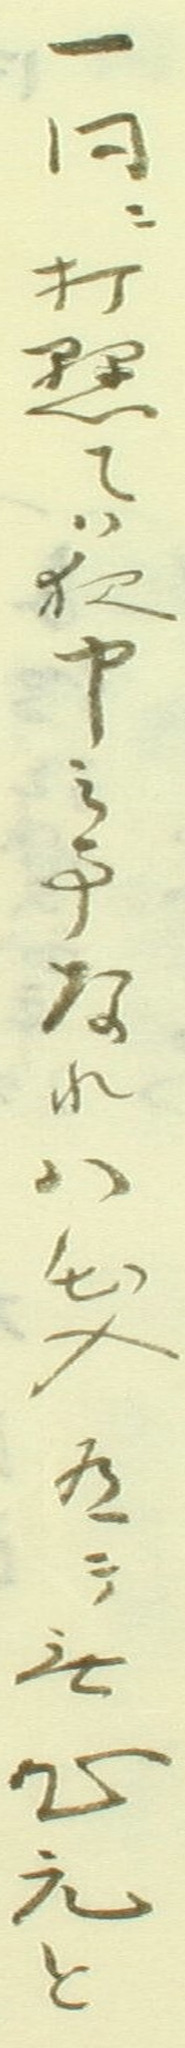一同に打懸ては夜中之之事なれは？入有て無心元と
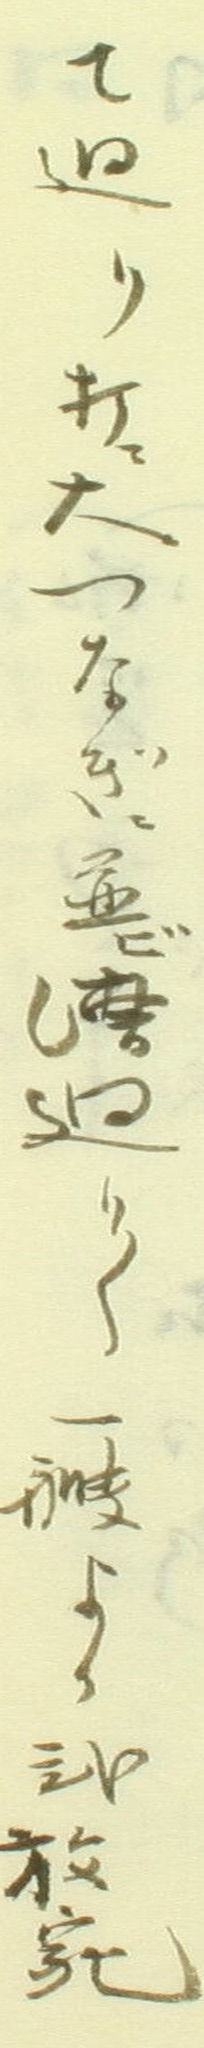て廻り打て大つなぎに並び漕廻り漕廻り一艘より弐放宛
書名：唐船漂流記 三
